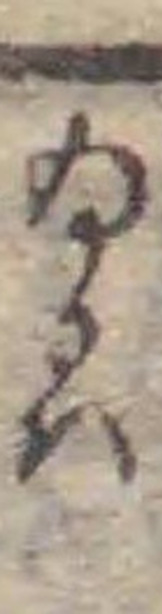ゐるは
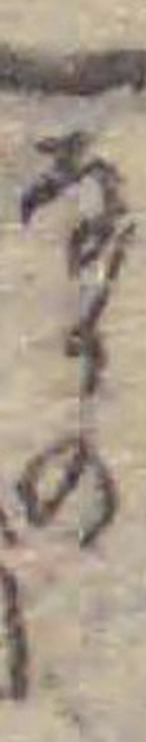なかの
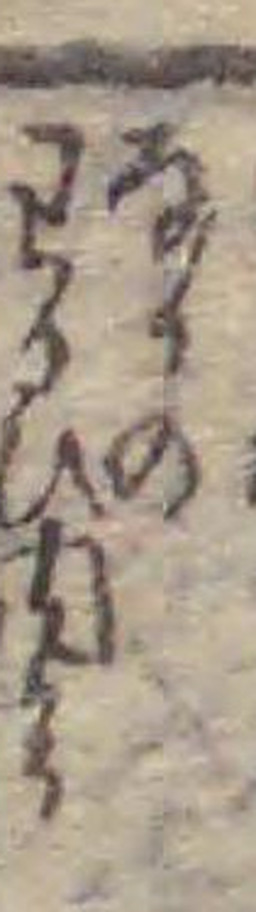わるひ内から
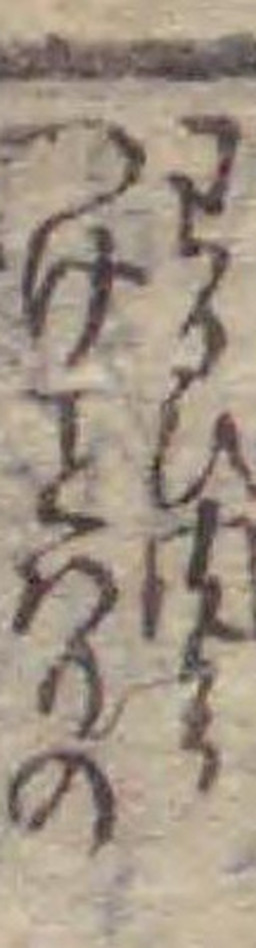つけことはりの
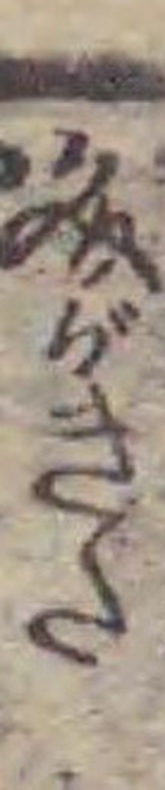文がきた
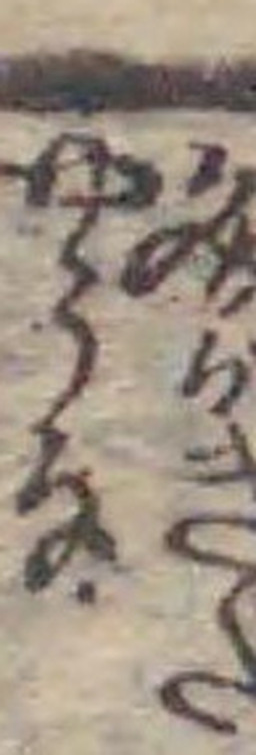やうな
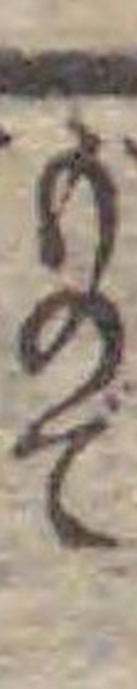もので
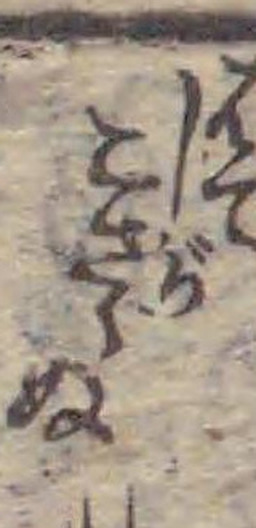ござらぬ

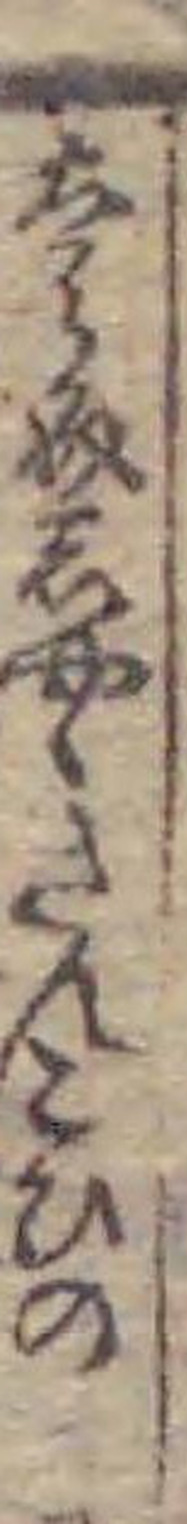太郎介しやくきんこひの
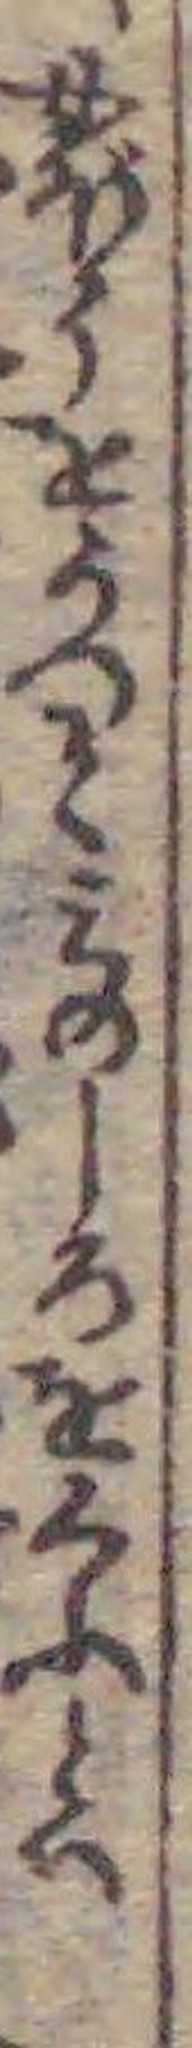〽女ぼうをうつてみのしろをくふとは
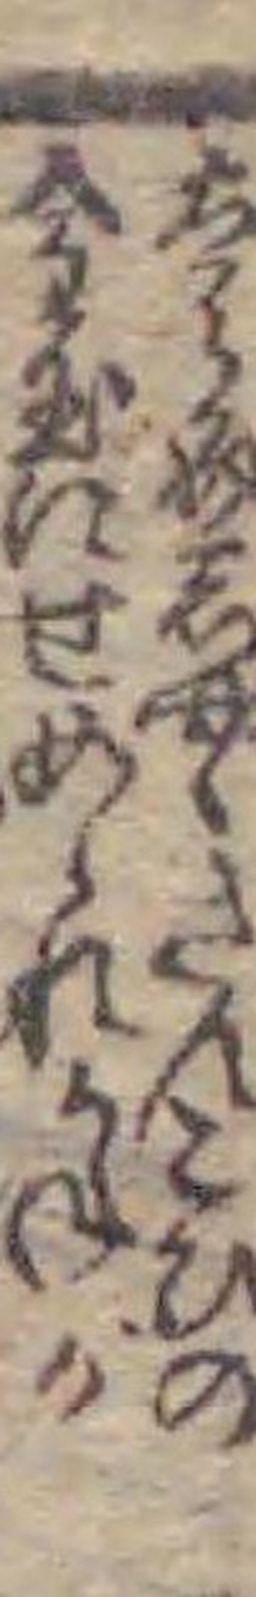金玉にせめられかねが
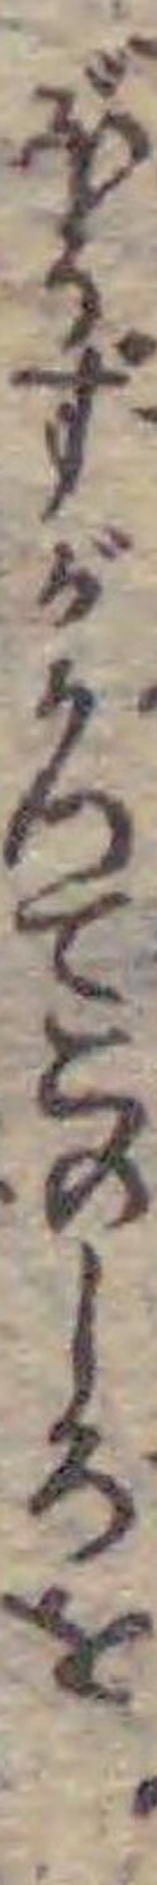ぼうずがかつてこのしろを
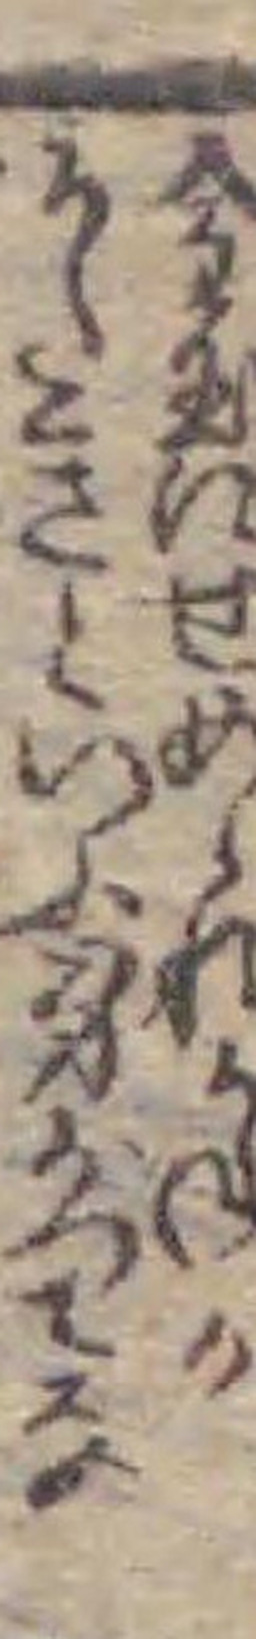かたきといふ身かつてな
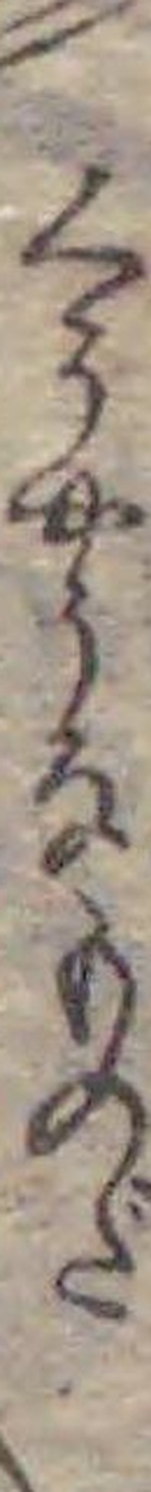くうやうなものだ
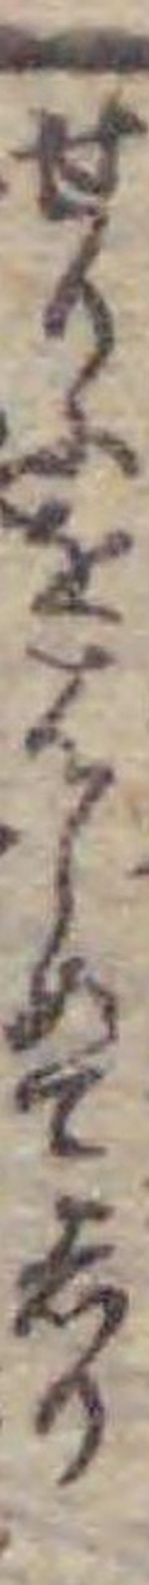せりふをはしめてしり
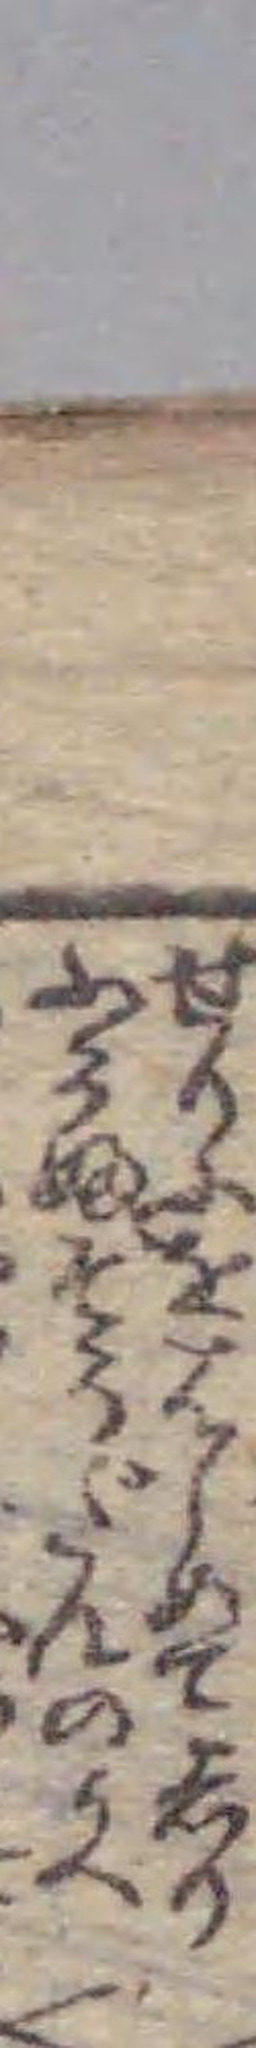ふうふそうだんのうへ
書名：四遍搨心学草帋 : 3巻
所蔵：国立国会図書館 National Diet Library, JAPAN
